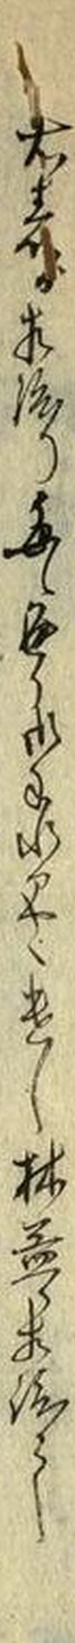右表ゟ相渡り毎々通り御手水部やへ遣之林益へ相渡之
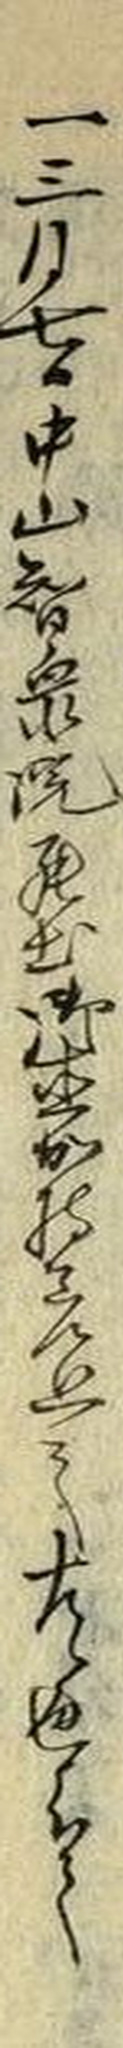一三月七日中山智泉院罷出御直加持差上之左之通被下之
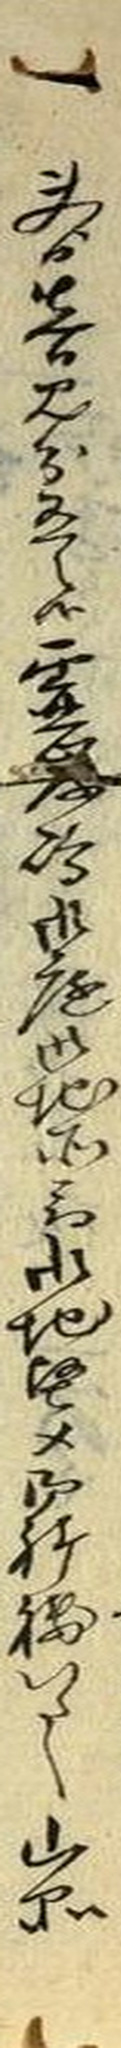夫ゟ先日見分有之候霊岸嶋御庭御地所ニ而御地堅メ御祈祷いたし山品
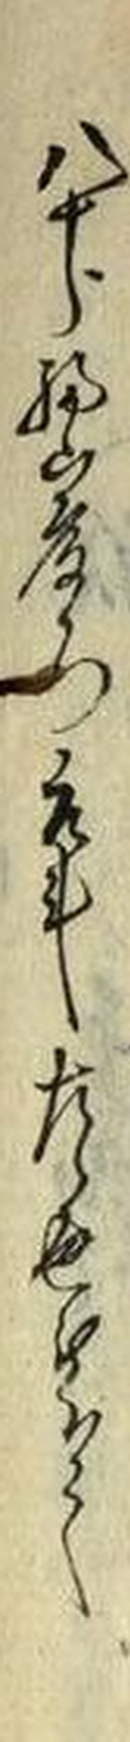八十郎福山藤右衛門取斗左之通被下之
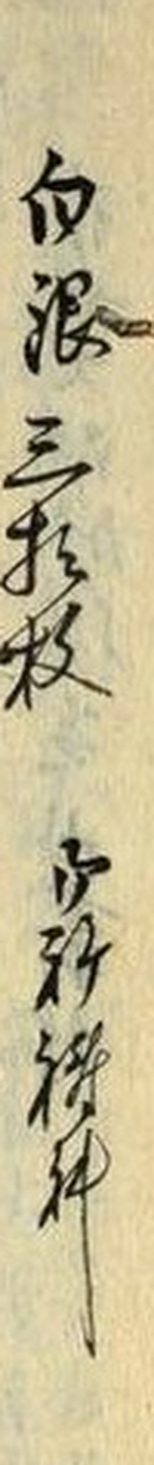白銀三拾枚御祈祷料
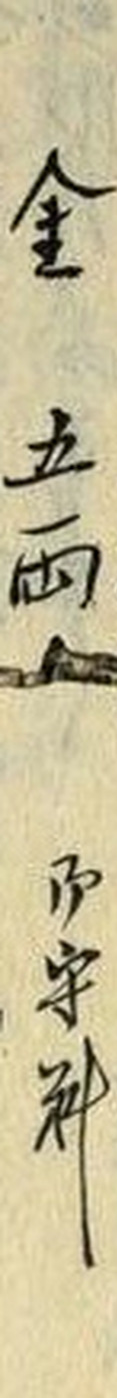金五両御守料
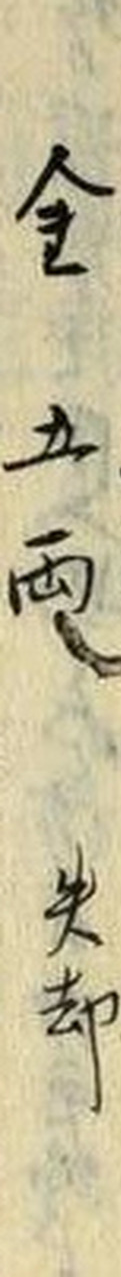金五両失却
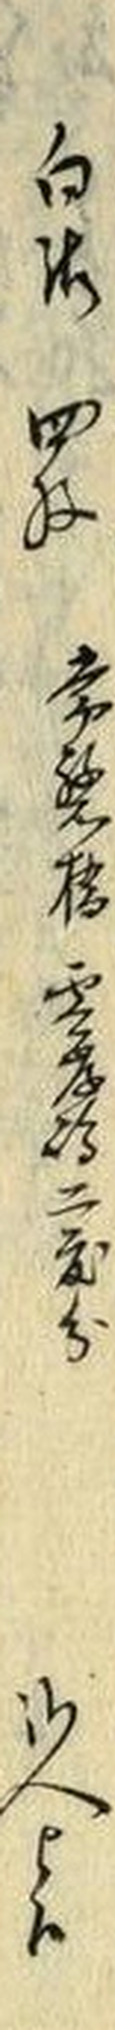白銀四枚常磐橋霊岸嶋二度分弐人被下
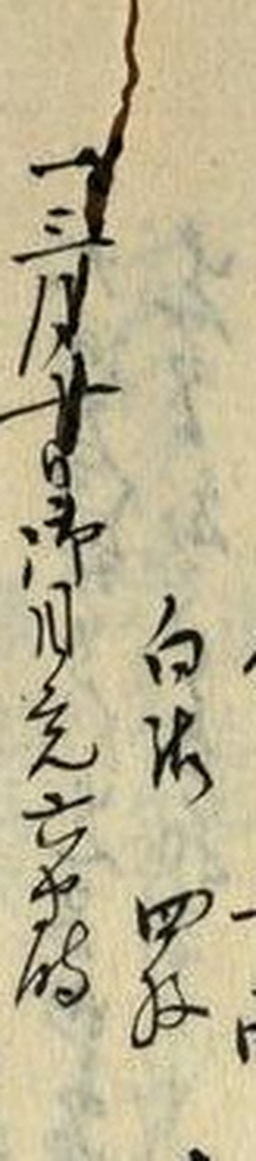一三月十日御目覚六半時
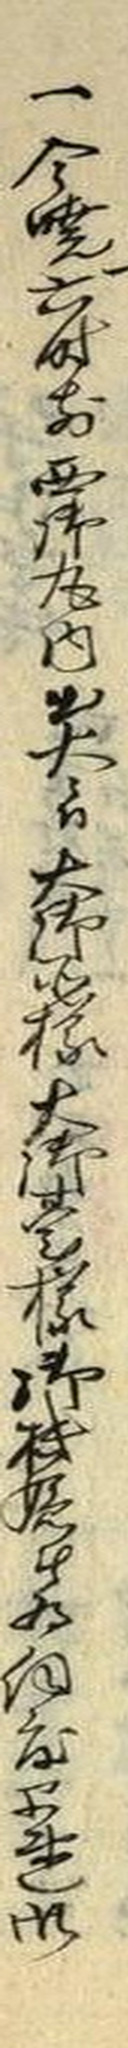一今暁六時前西御丸内出火ニ付大御所様大御台様御機嫌被為伺度早速御
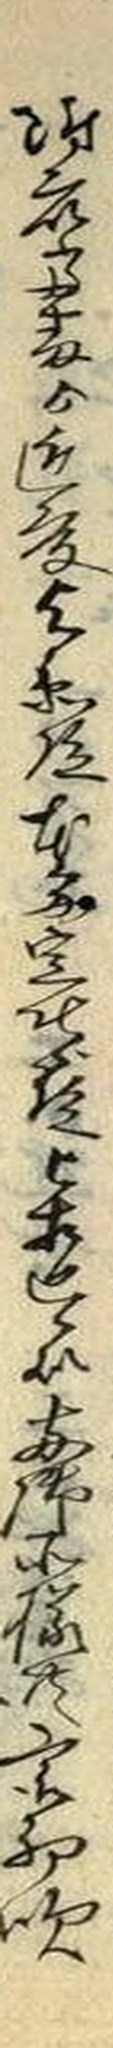附衆当番ゟ近藤与兵衛本多定次郎殿被相廻候処両御所様共最初吹
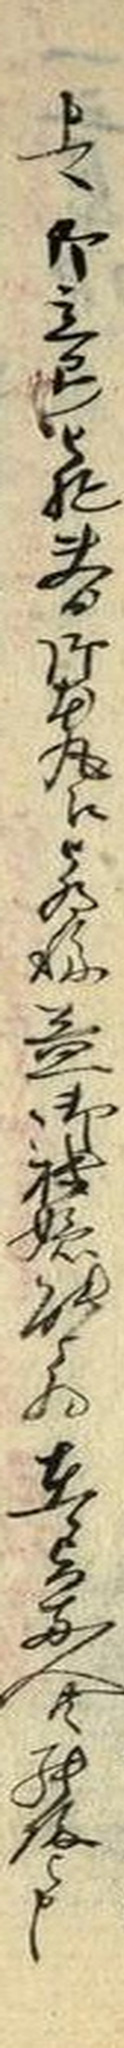上へ御立退被遊夫ゟ御本丸江被為移益御機嫌能被為在候旨両人共罷帰被申
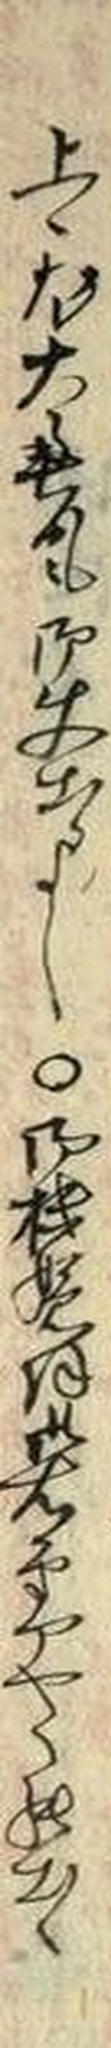上候尤大奥ゟも御使出候よし○御機嫌伺御右筆部やへ罷出候
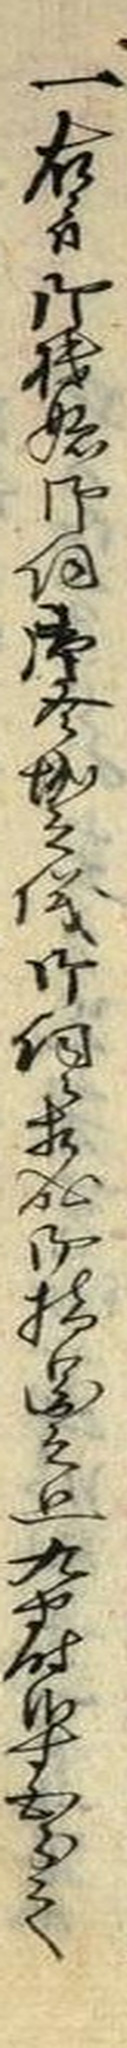一右ニ付御機嫌御伺御登城之儀御伺候相成御指図之上九半時弐寸五分之
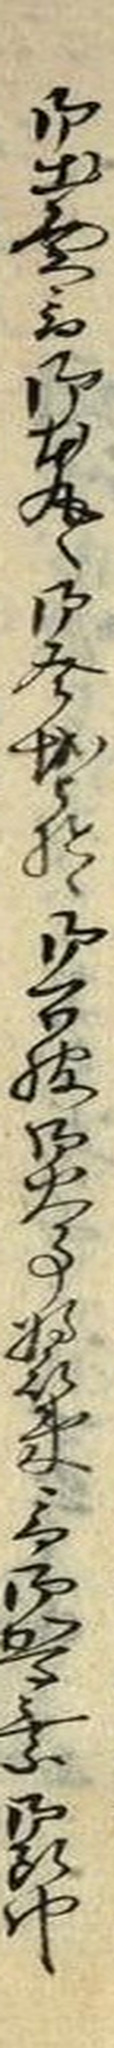御出殿ニ而御本丸へ御登城被遊候御召服御火事装束ニ而御駕乗御頭巾
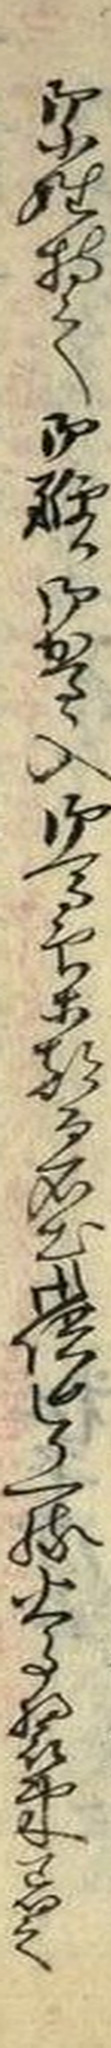御小姓持之御鞭ハ御駕へ入御馬印等都而不出御供廻り一統火事装束着之
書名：少傅日録抄（斉善付側向頭取日記、江戸并道中、初入在国、逝去後…
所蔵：福井県文書館 Fukui Prefectural Archives
